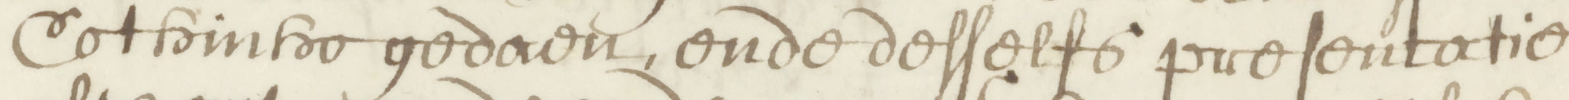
Cothinho gedaen, ende desselfs presentatie
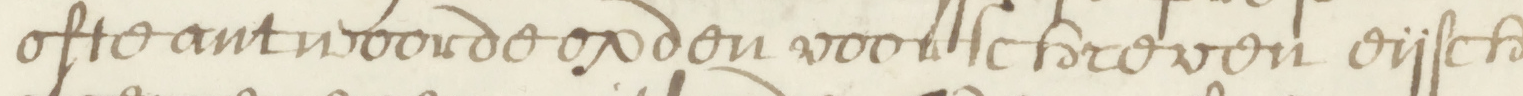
ofte antwoorde opden voorschreven eijsch
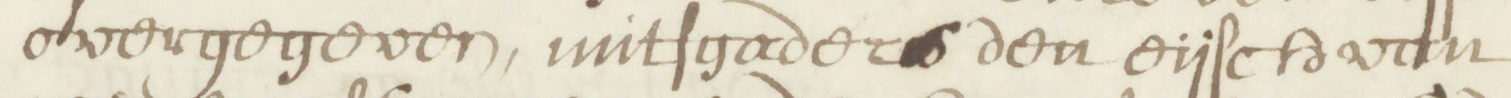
overgegeven, mitsgaders den eijsch van
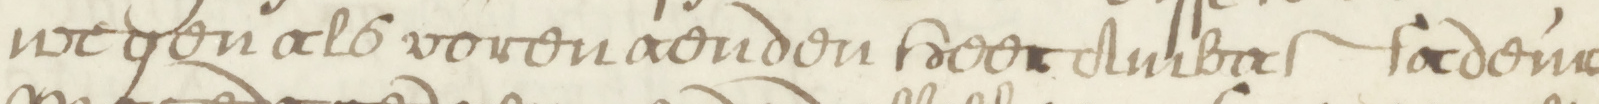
wegen als voren aenden heer Ambassadeur
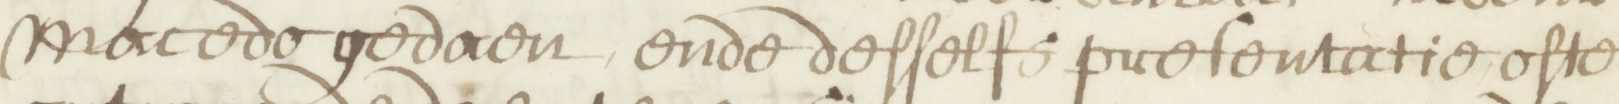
Macedo gedaen, ende desselfs presentatie ofte
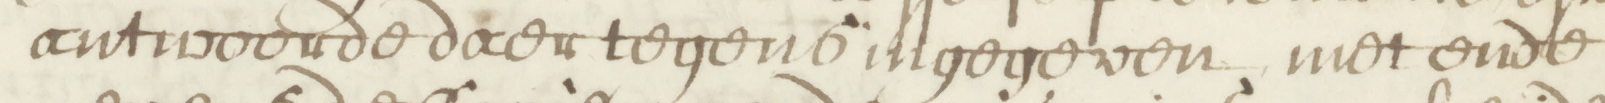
antwoorde daer tegens ingegeven, met ende
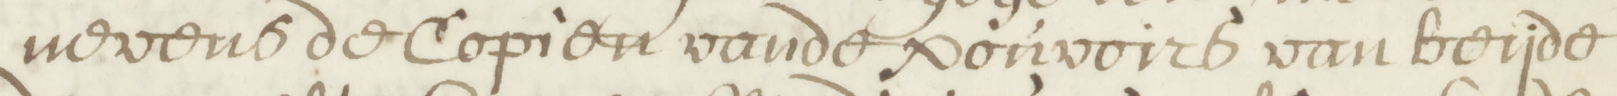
nevens de Copien vande pouvoirs van beijde
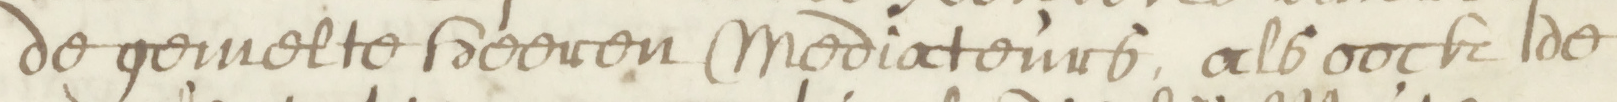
de gemelte heeren Mediateurs, als oock de
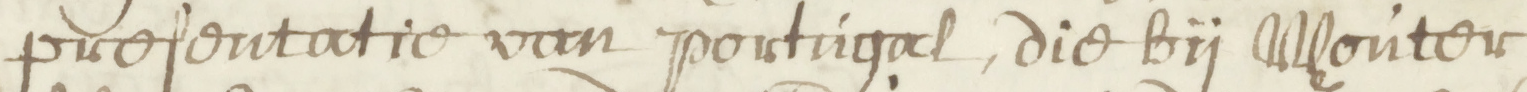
presentatie van portugal, die bij Wouter
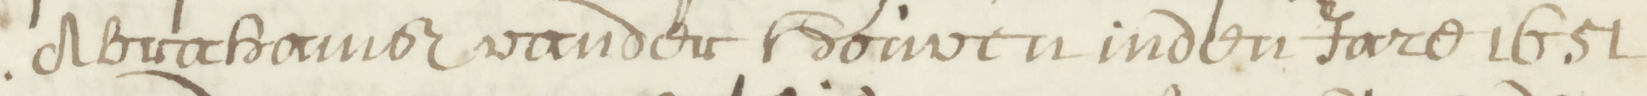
Abrahamsz vander Houven inden Jare 1651
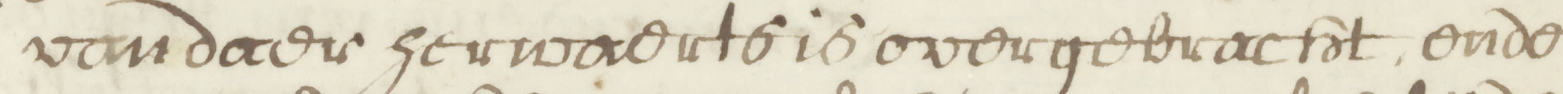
vandaer herwaerts is overgebracht, ende
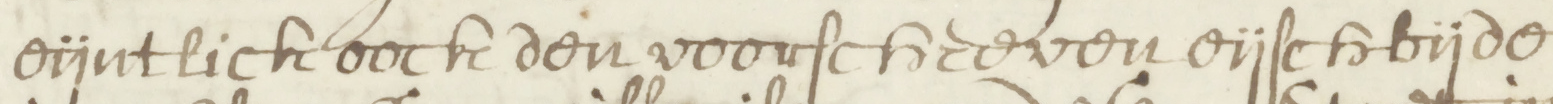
eijntlick oock den voorschreven eijsch bijde
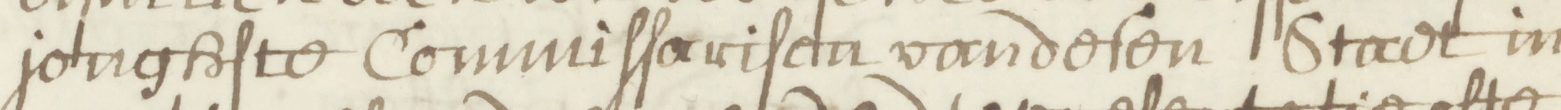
jonghste Commissarisen van desen Staet in
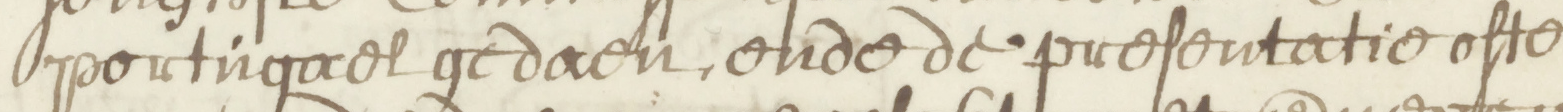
portugael gedaen, ende de presentatie ofte
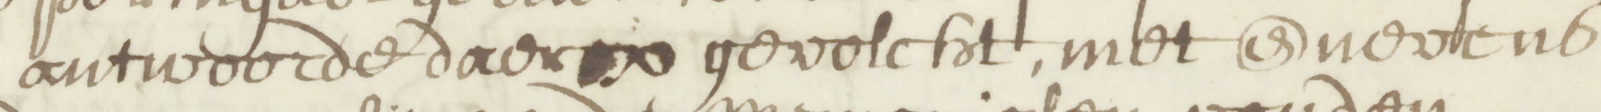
antwoorde daerop gevolcht, met & nevens
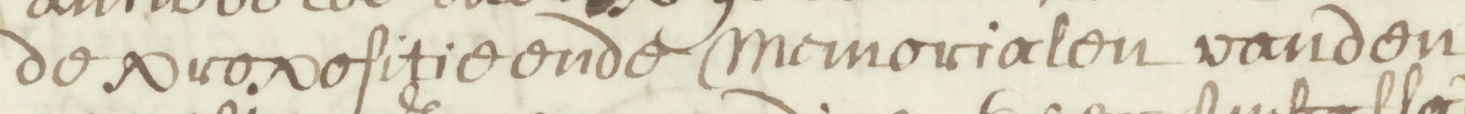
de propositie ende Memorialen vanden
